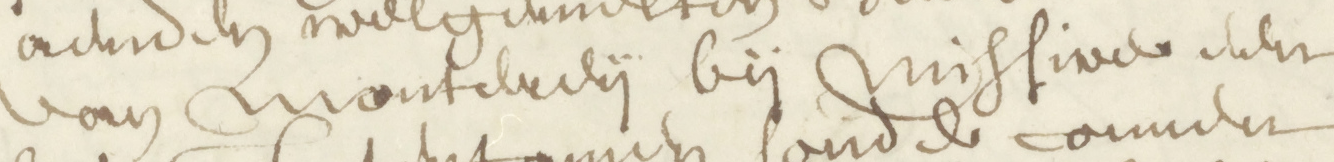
van Montereij bij Missive den
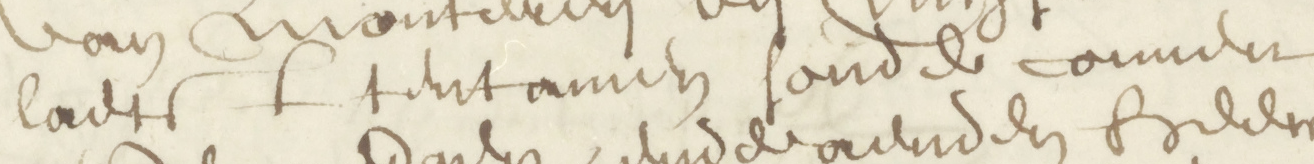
laetst tentamen soude connen
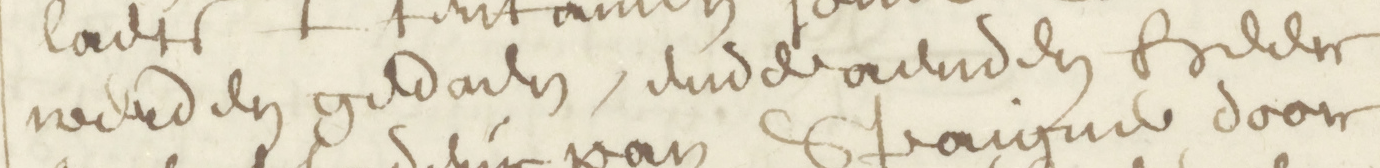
werden gedaen, ende aenden Heer
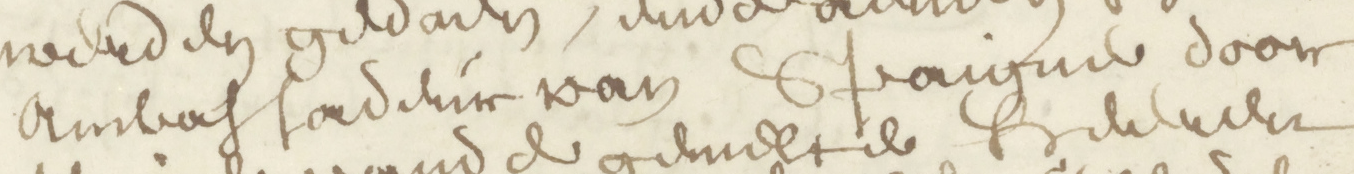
Ambassadeur van Spaignie door
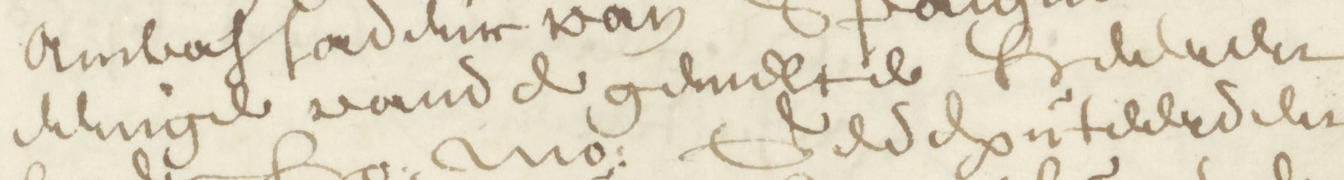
eenige vande gemelte Heeren
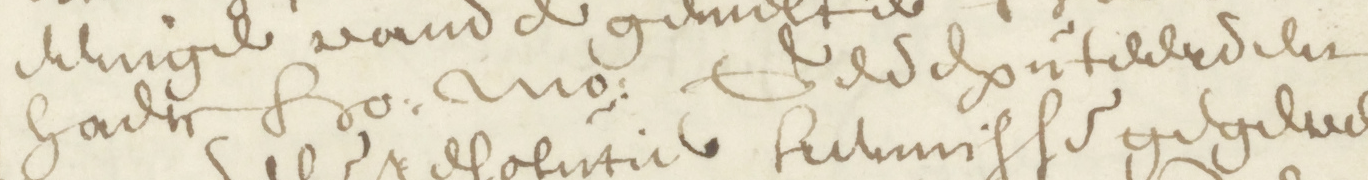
haer Ho:Mo: Gedeputeerden
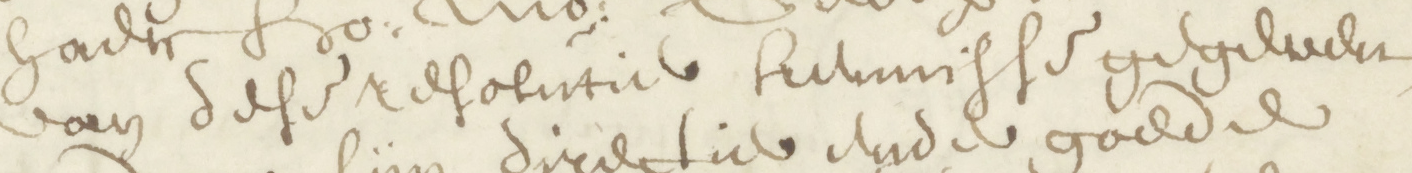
van dese resolutie kennisse gegeven
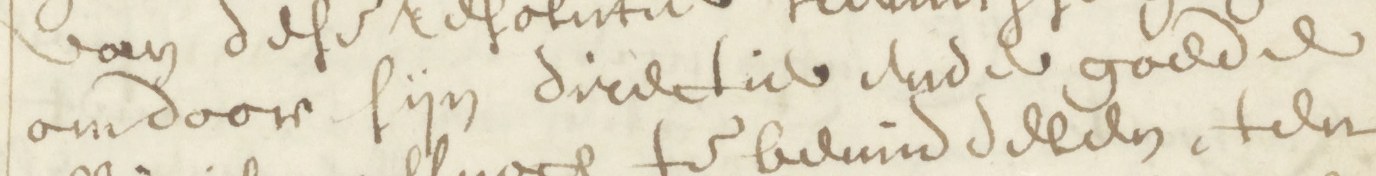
om door sijn directie ende goede
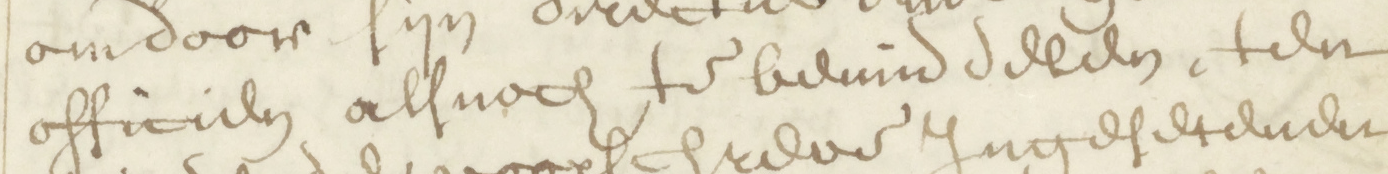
officien alsnoch te bemiddelen, ten
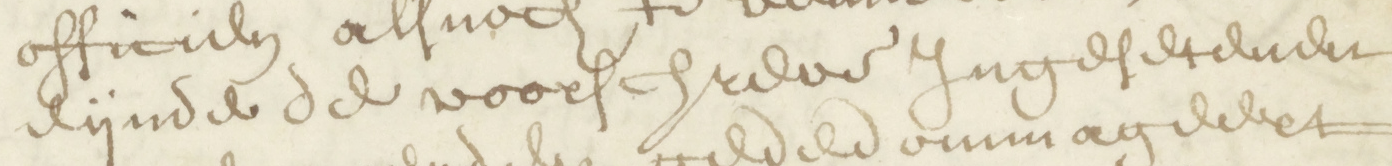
eijnde de voorschreve Ingesetenen
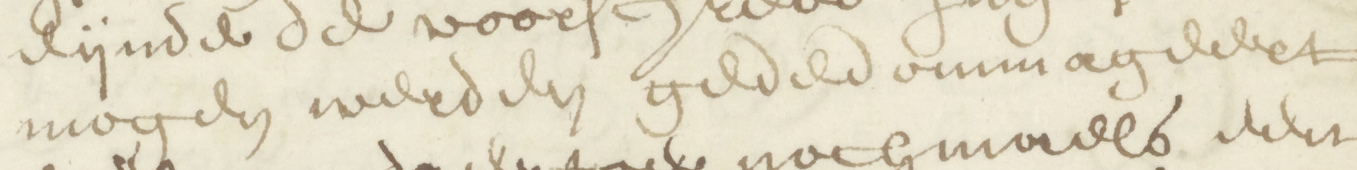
mogen werden gededommageert
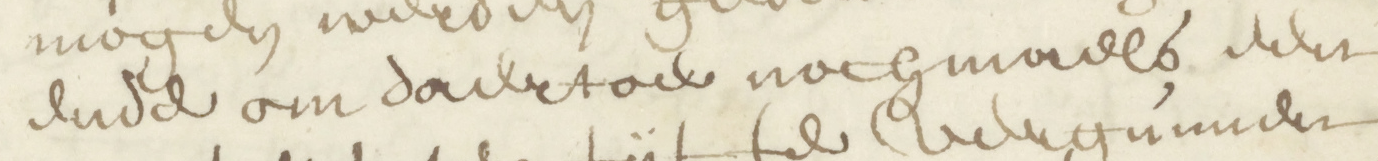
ende om daertoe nochmaels een
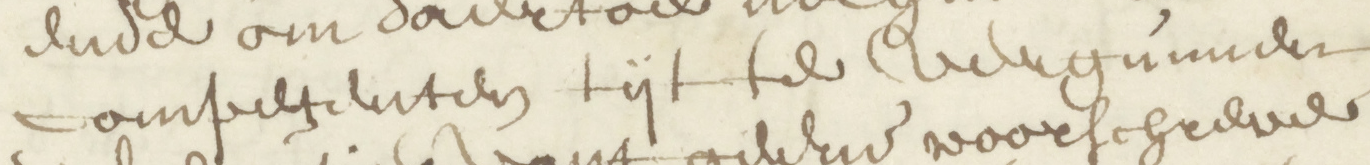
competenten tijt te vergunnen
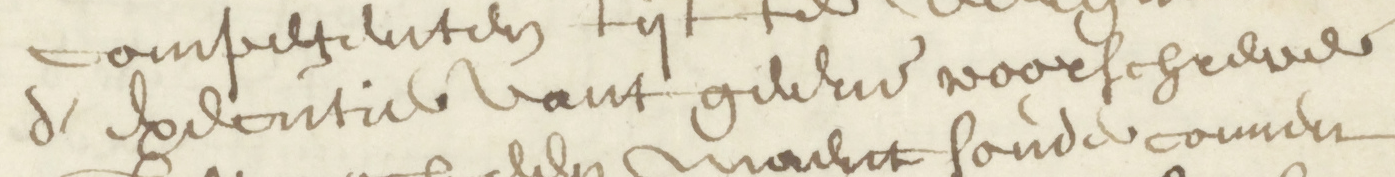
d‛executie vant geene voorschreve
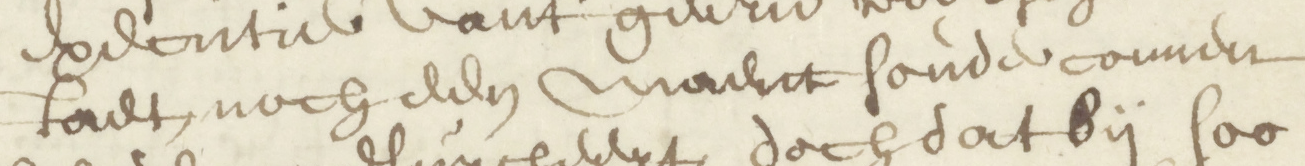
staet, noch een maent soude connen
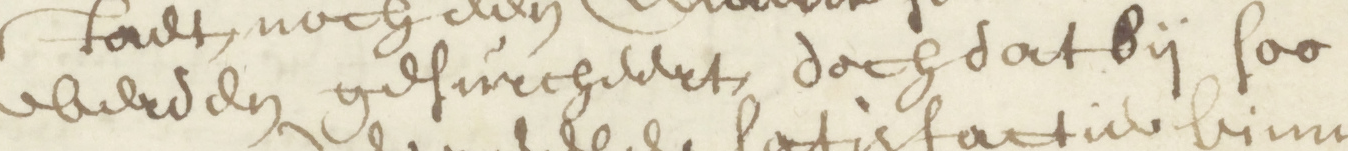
werden gesurcheert, doch dat bij soo
